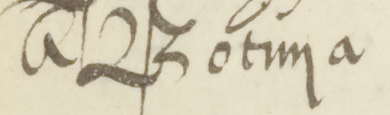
A Botnya
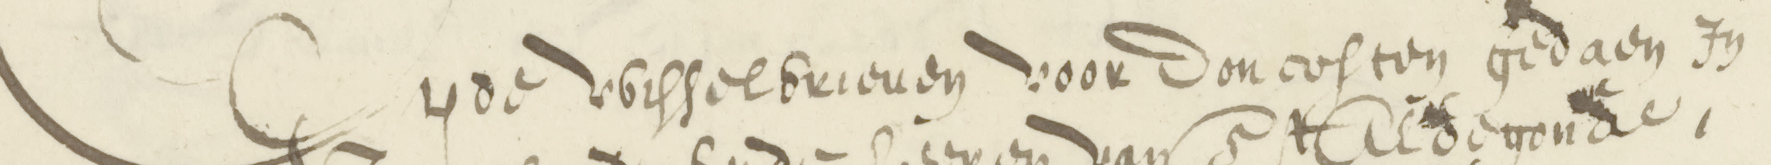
Opde wisselbrieuen voor Doncosten gedaen in
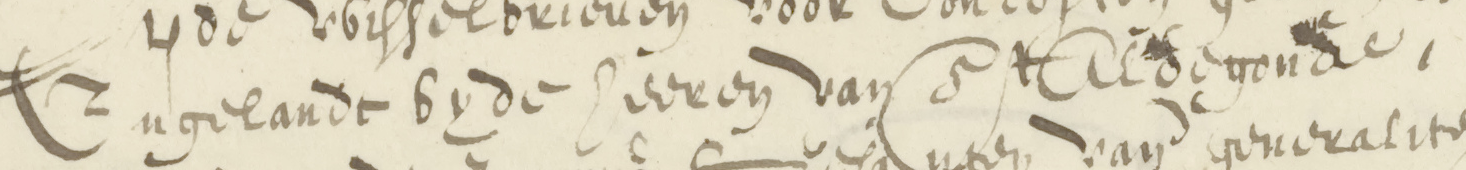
Engelandt by de heeren van St Aldegonde,
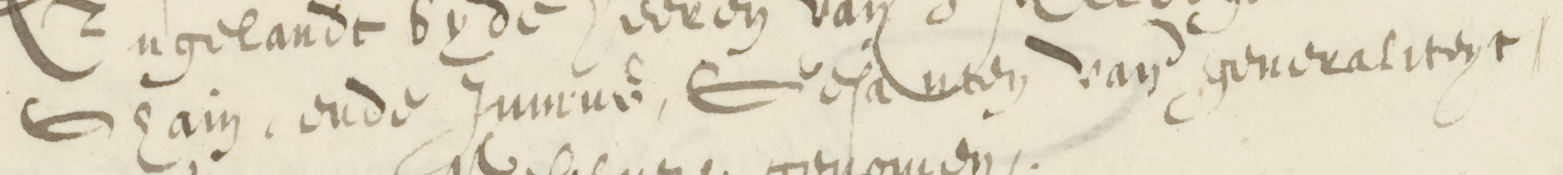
Ghain, ende Junius, Gesanten van generaliteyt,
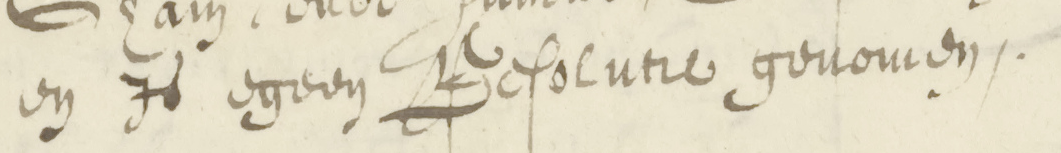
en is egeen Resolutie genomen.
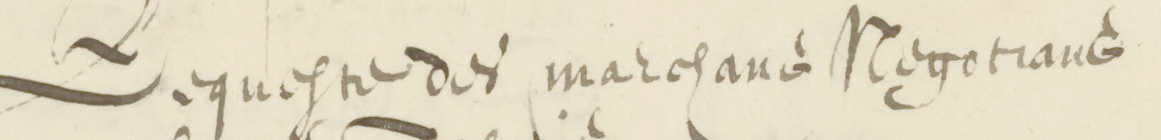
Requeste des marchans Negotians
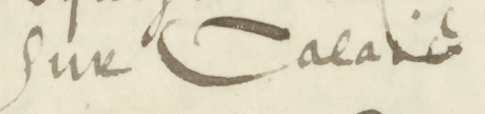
sur Calais
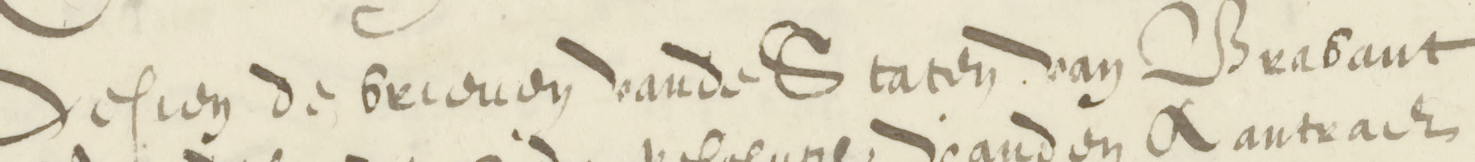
Gesien de brieun vande Staten van Brabant
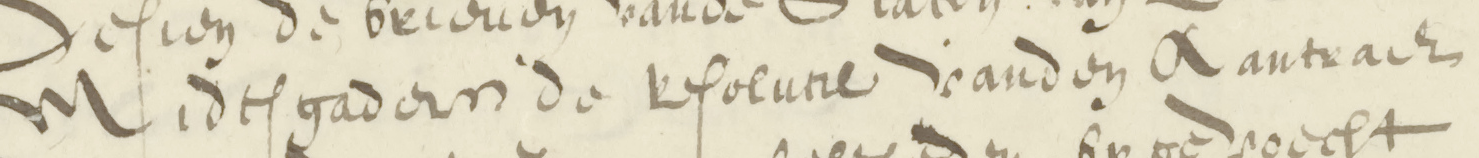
Midtsgaders de resolutie vanden Aautraet
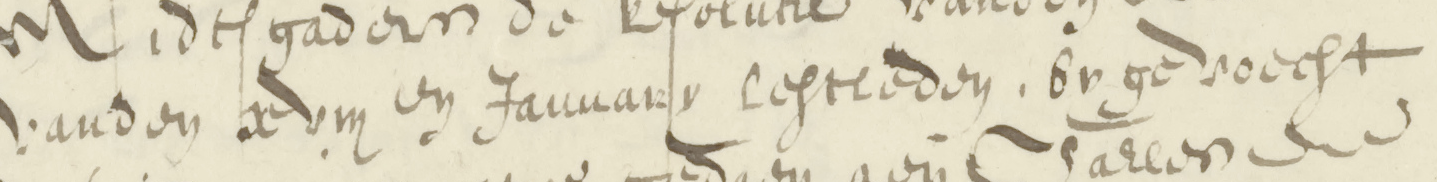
vanden xviiien January lestleden, by gevoecht
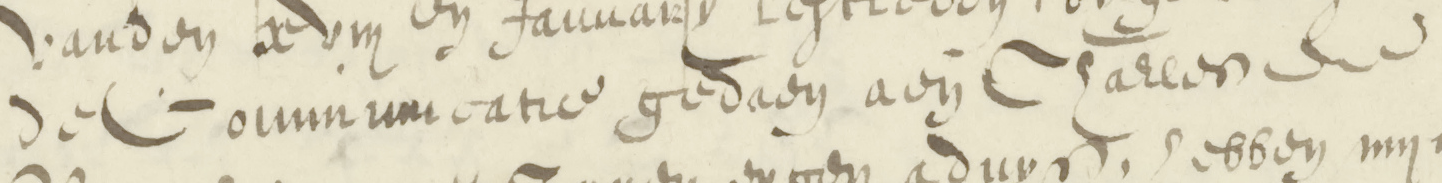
de Communicatie gedaen aen Charles de
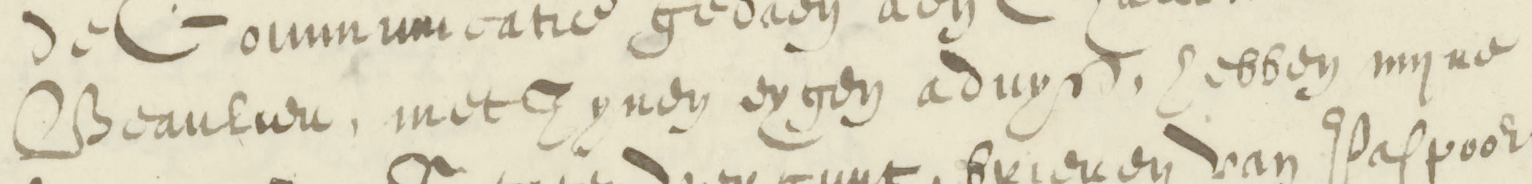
Beaulieu, met zynen eygen aduys, hebben myne
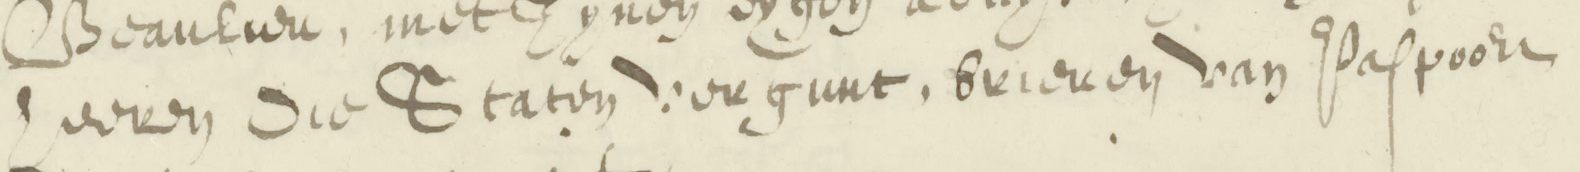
heeren die Staten vergunt, brieuen van Paspoort
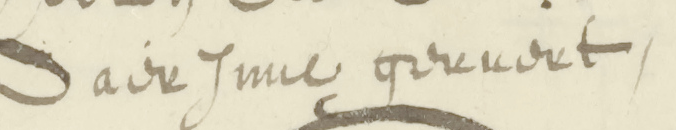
DaerInne geruert.
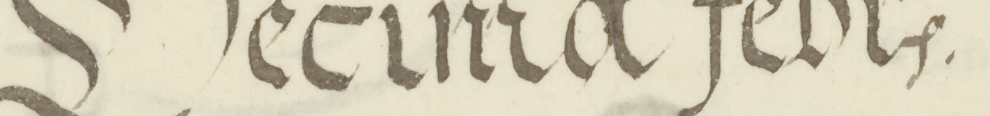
Decima febr.
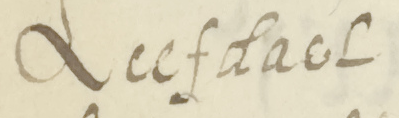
Leefdael
